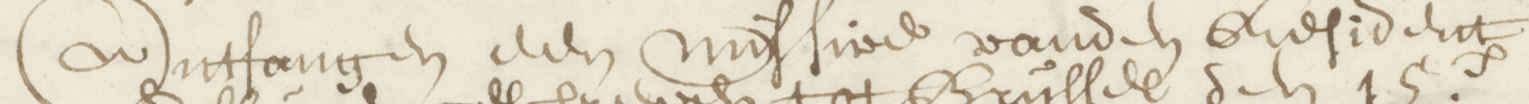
Ontfangen een missive vanden Resident
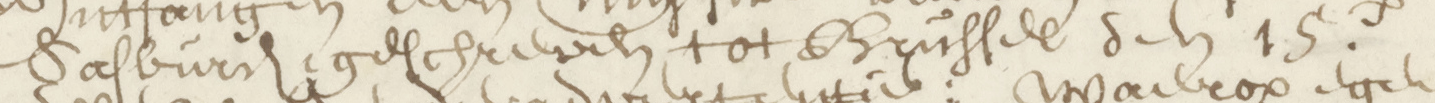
Sasburch, geschreven tot Brussel den 15en.
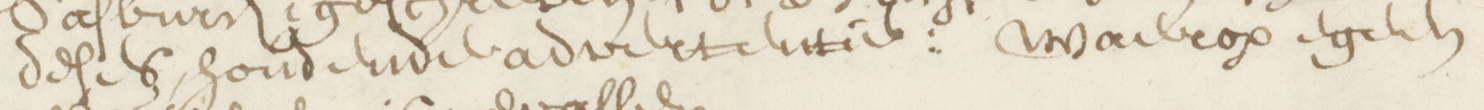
deses, houdende advertentie: Waerop egeen
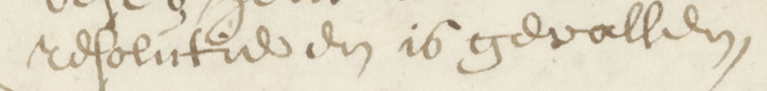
resolutie en is gevallen.
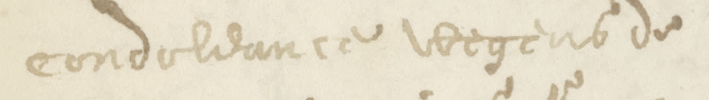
condoleance wegens de
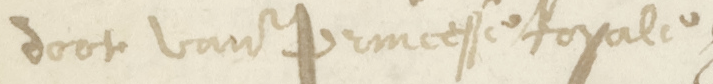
doot van Princesse Royale
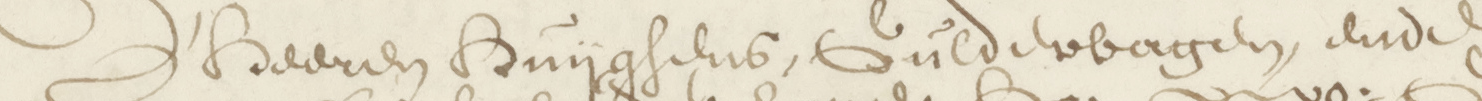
D'Heeren Huijghens, Guldewagen, ende
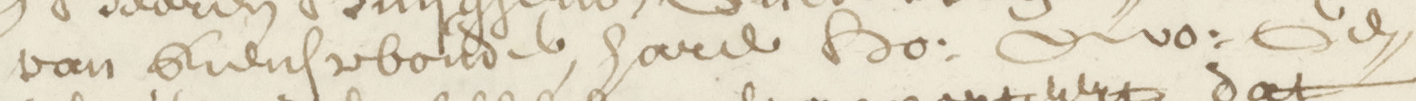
van Renswoude hare Ho:Mo: Ge,,
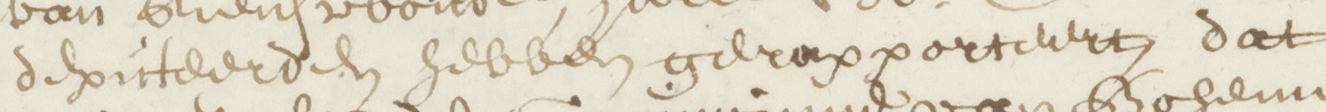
deputeerden hebben gerapporteert, dat
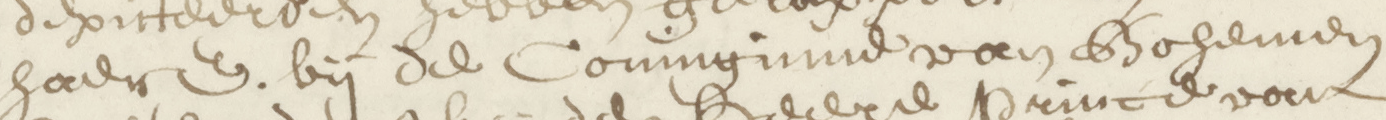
haer E. bij de Coninginne van Bohemen
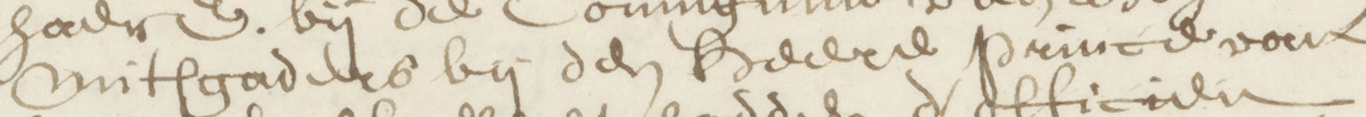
mitsgaders bij den Heere prince van
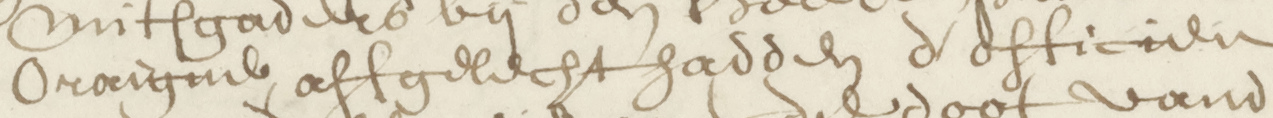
Oraigne affgelecht hadden d'officien
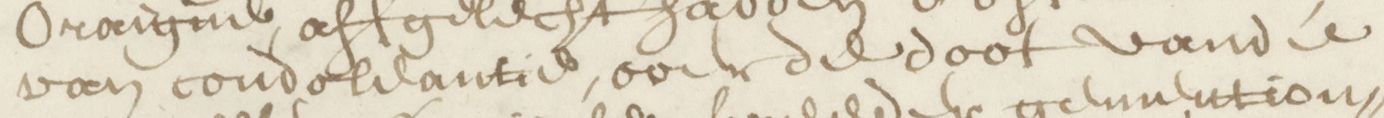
van condoleantie, over de doot vande
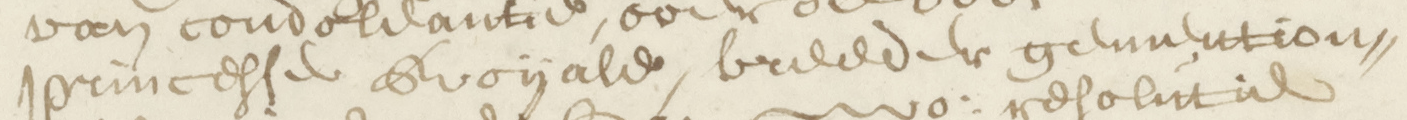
princesse Roijale, breeder gemention„
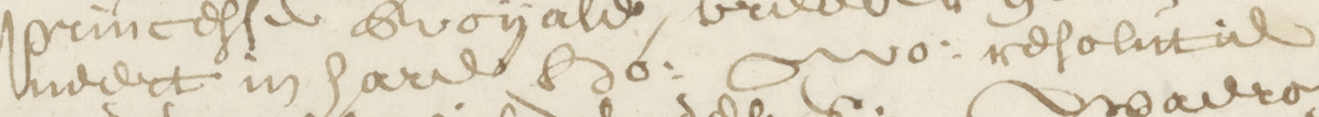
neert in hare Ho:Mo: resolutie
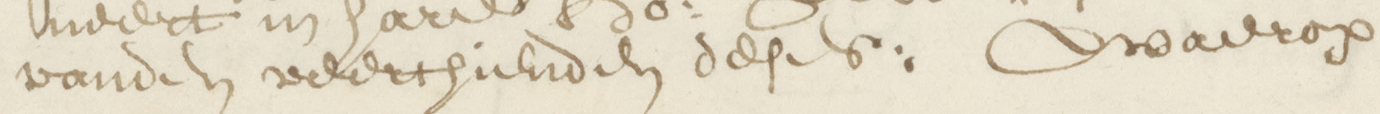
vanden veerthienden deses: Waerop
